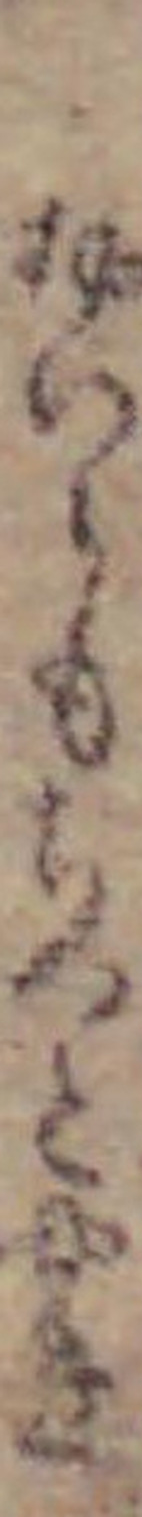おいらもちつとやき
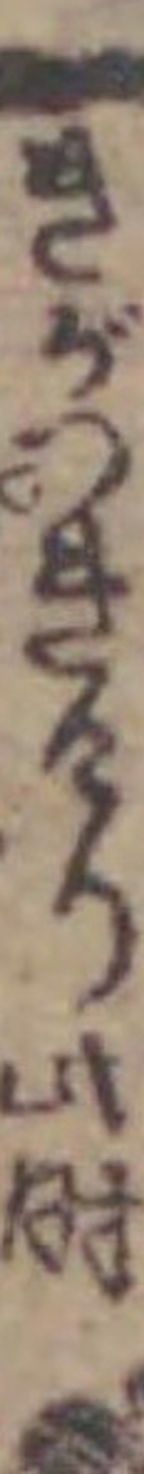きがつきけり此時
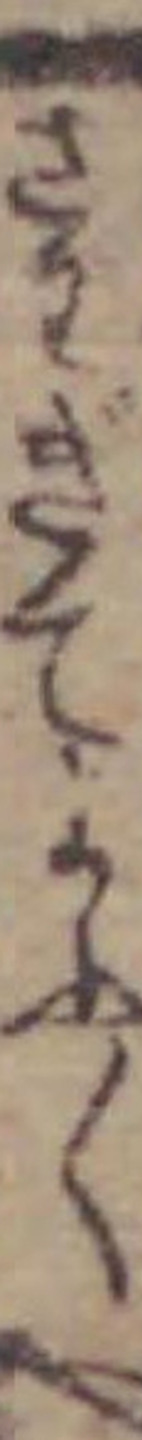さわぎてよふ〳〵
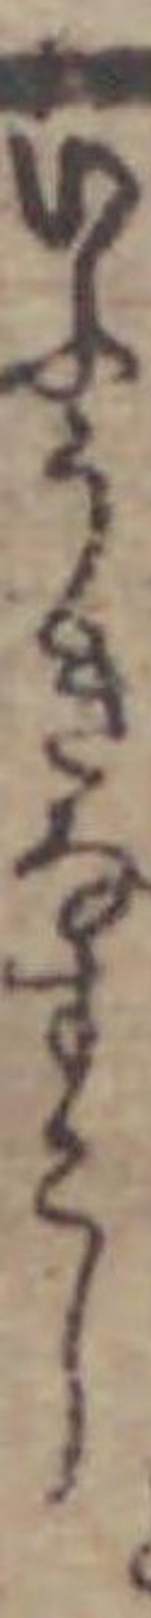いふうきなすこし
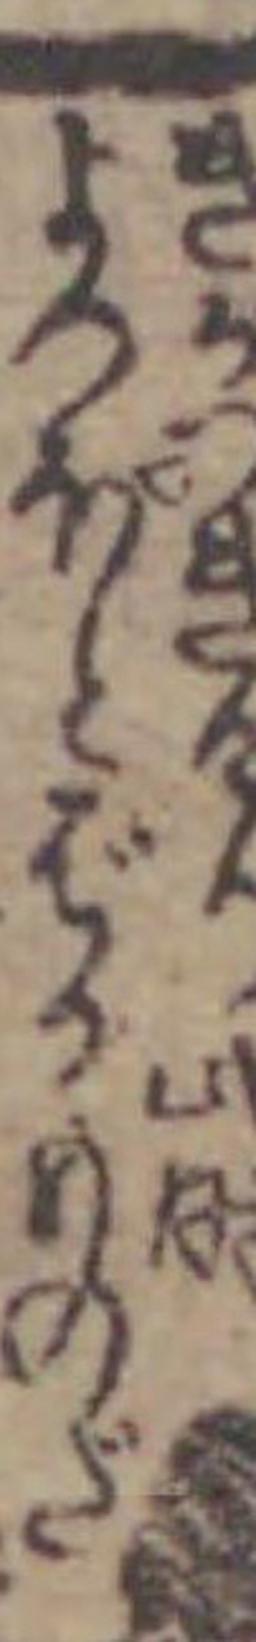よつぽとばかものだと
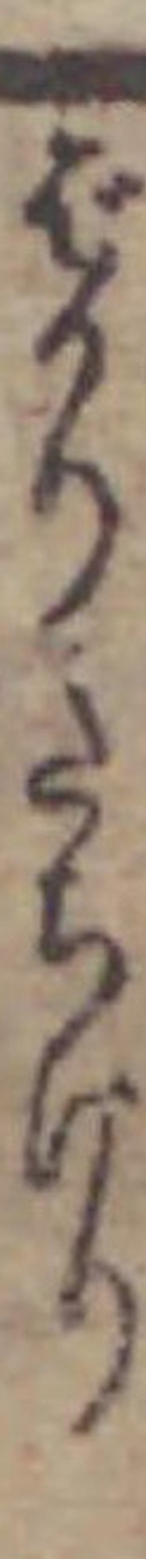ばかりたちけり
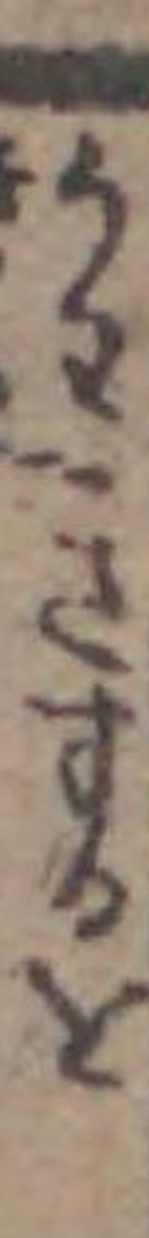うわさするを
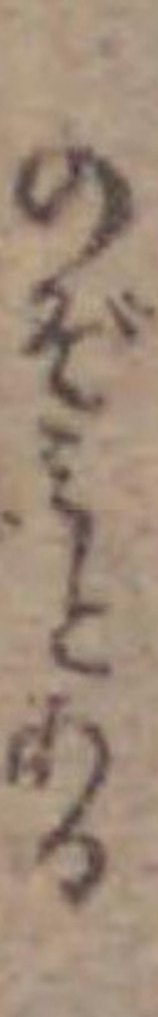のぞみとある
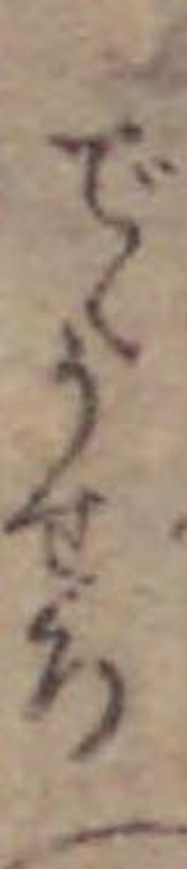でゝうせろ
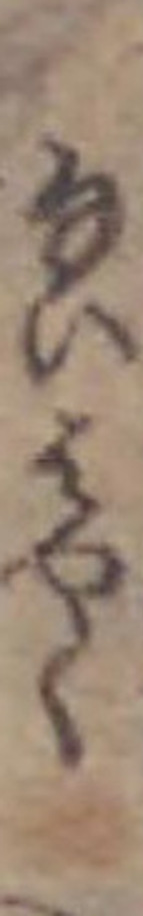ないはやく
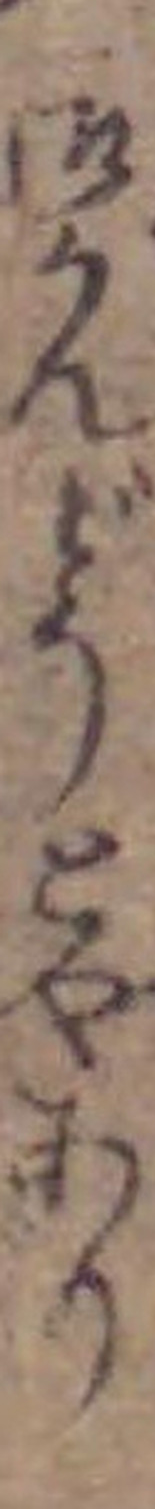御かんどうとやあり
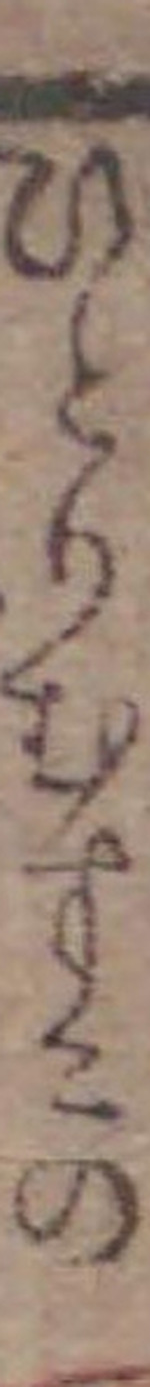ひとりむすこの
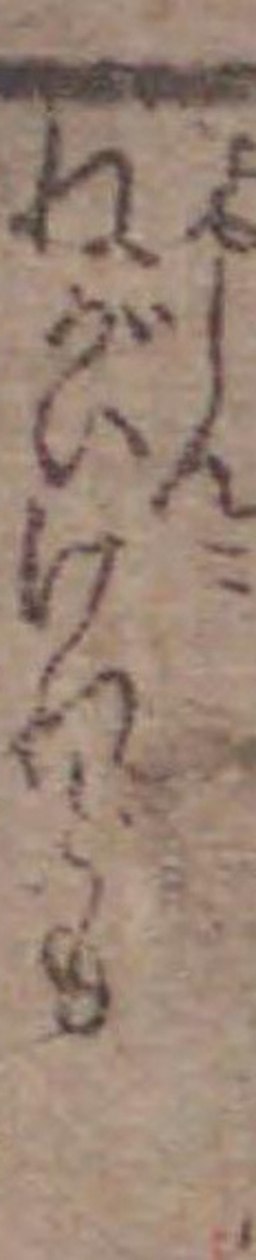ねがいけれども
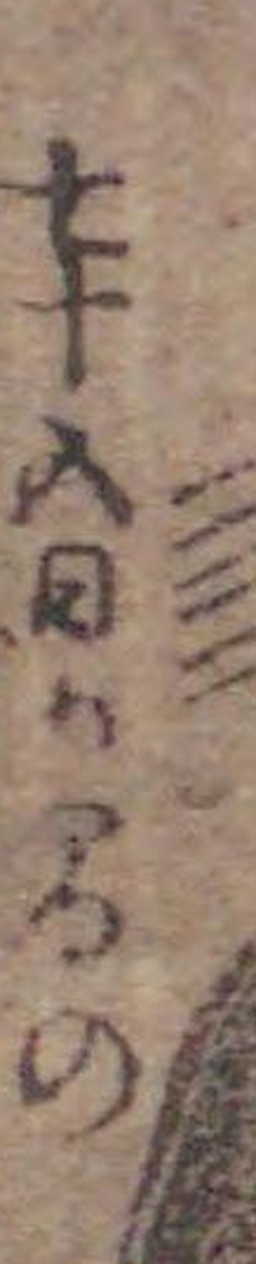七十五日か間の
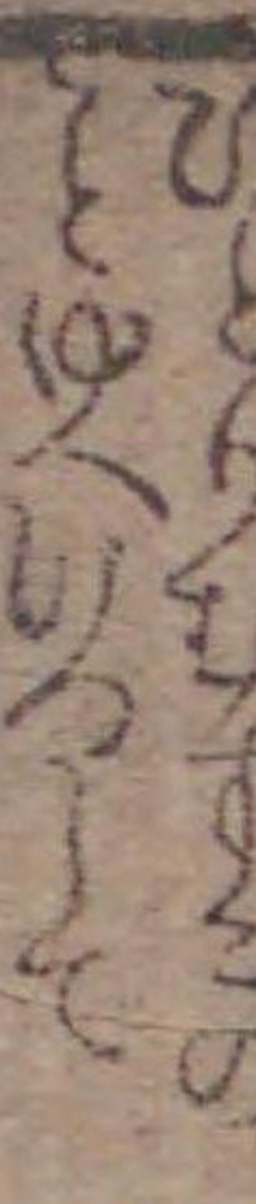ことゆへけつして
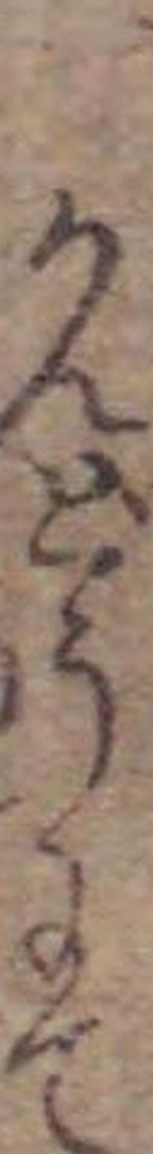かんどうを
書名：江戸生艶気樺焼 : 3巻
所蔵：国立国会図書館 National Diet Library, JAPAN
